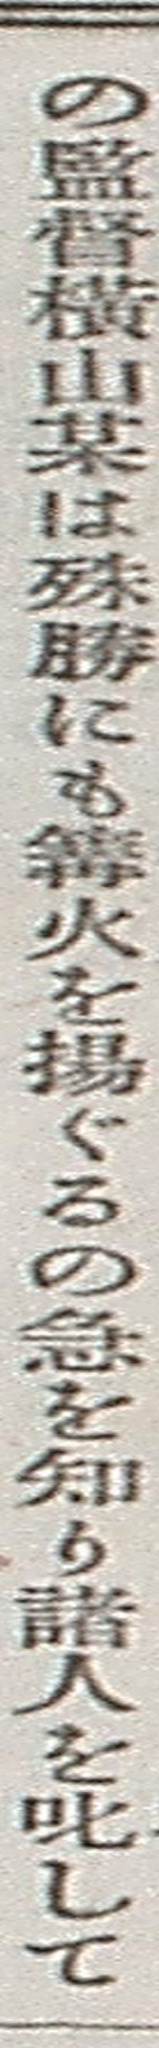の監督横山某は殊勝にも篝火を揚ぐるの急を知り緒人を叱して
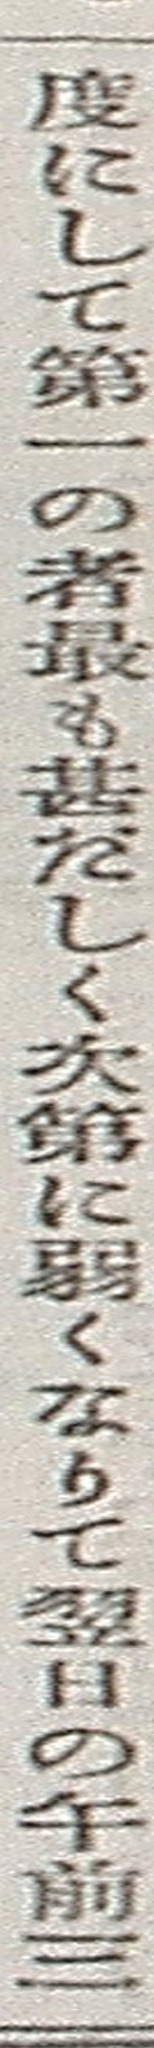度にして第一の者最も甚だしく次第に弱くなりて翌日の午前三

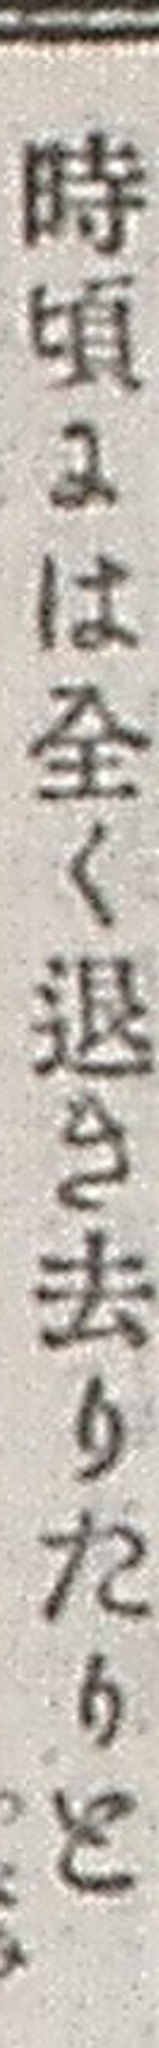時頃には全く退き去りたりと
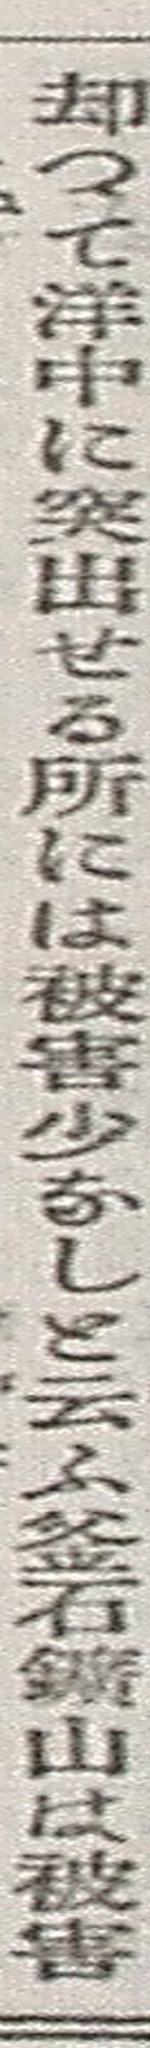却つて洋中に突出せる所には被害少なしと云ふ釜石鉱山は被害
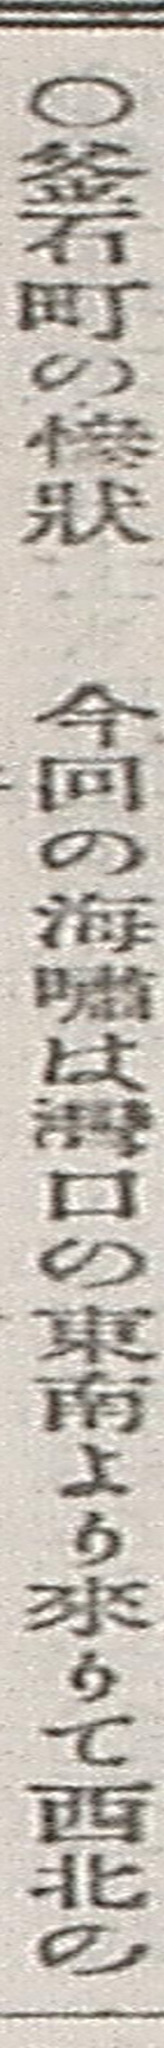○釜石町の惨状今回の海嘯は湾口の東南より来りて西北の
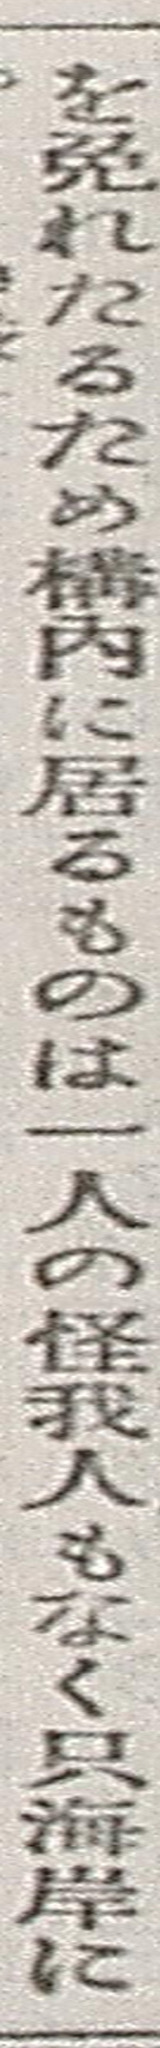を免れたるため構内に居るものは一人の怪我人もなく只海岸に
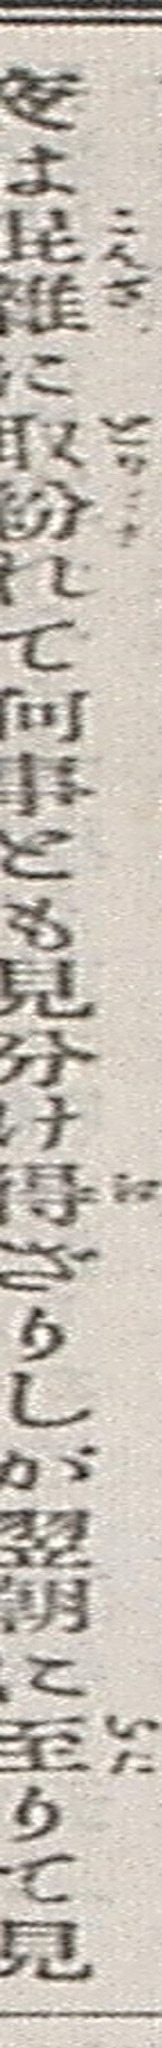夜は混雑に取紛れて何事とも見分け得ざりしが翌朝に至りて見
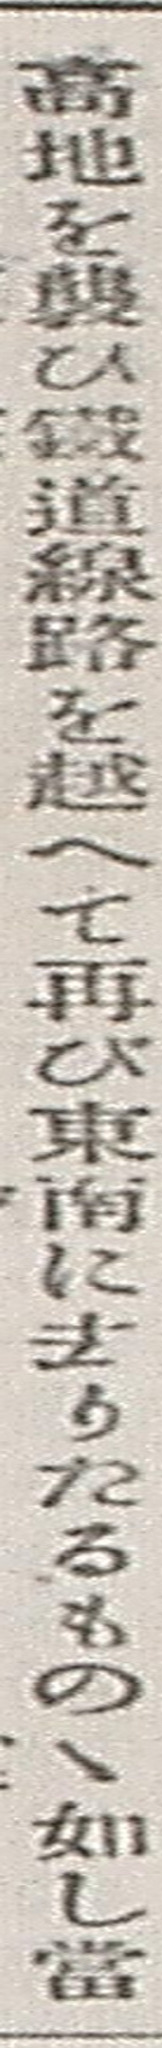高地を襲ひ鉄道線路を越へて再び東南に去りたるものゝ如し当
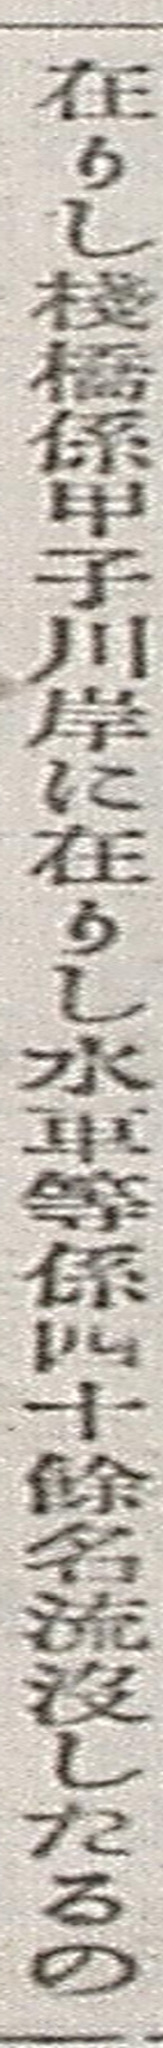在りし桟橋係甲子川岸に在りし水車等係四十余名流没したっるの
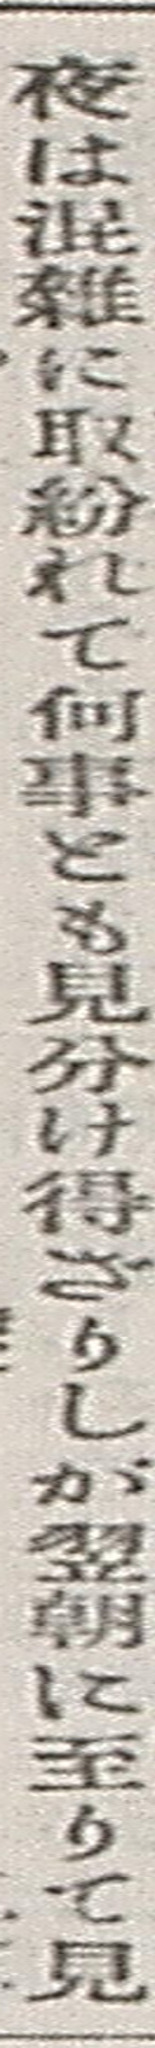夜は混雑に取紛れて何事とも見分け得ざりしが翌朝に至りて見
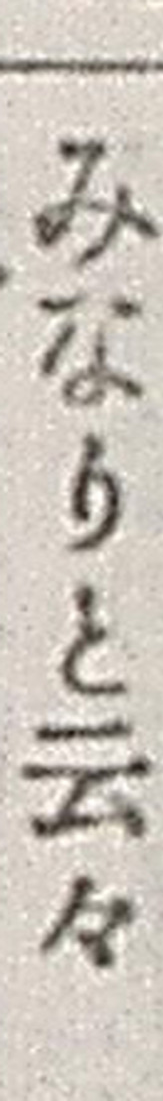みなりと云々
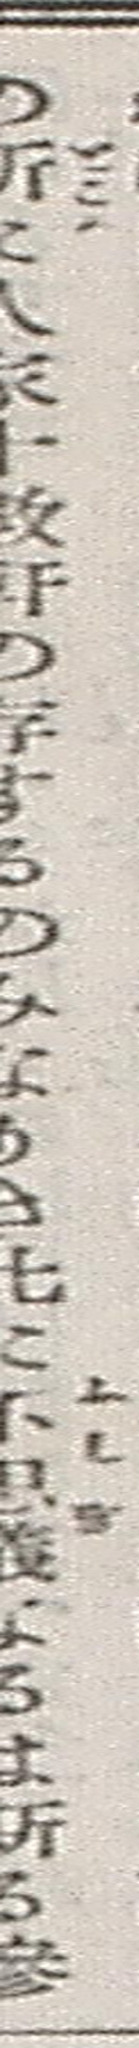の所に人家十数軒の存するのみなりき此に不思儀なるは斯る惨
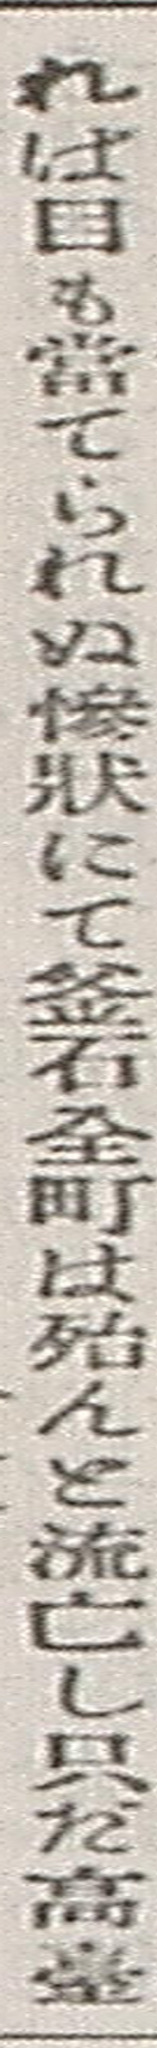れば目も当てられぬ惨状にて釜石全町は殆んど流亡し只だ高台
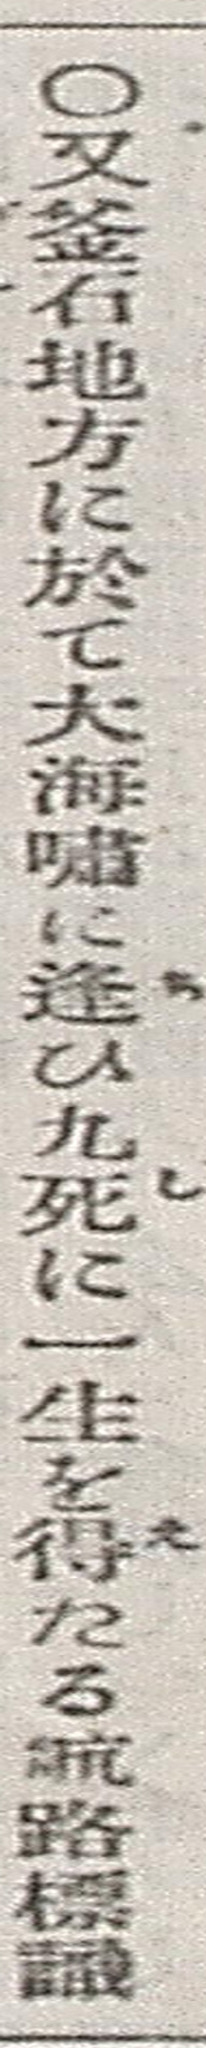○又釜石地方に於て大海嘯に逢ひ九死に一生を得たる航路標識
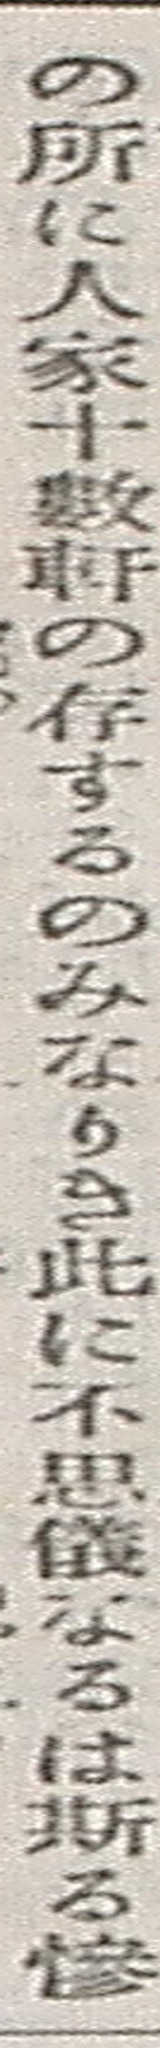の所に人家十数軒の存するのみなりき此に不思儀なるは斯る惨
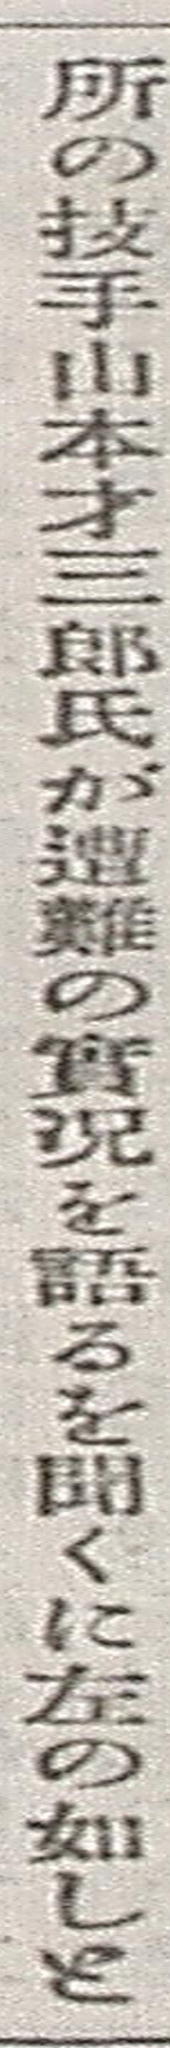所の技手山本才三郎氏が遭難の実況を語るを聞くに左の如しと
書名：風俗畫報臨時増刊第百二十號　大海嘯被害録（下）
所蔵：東京大学地震研究所図書室 Earthquake Research Institute Library, The University of Tokyo, JAPAN
